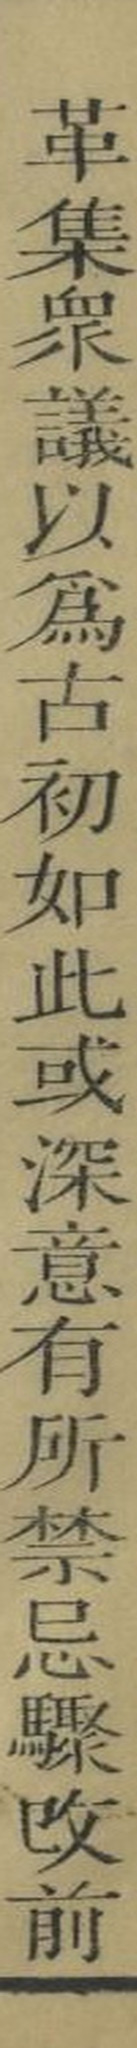革集衆議以為古初如此或深意有所禁忌驟改前
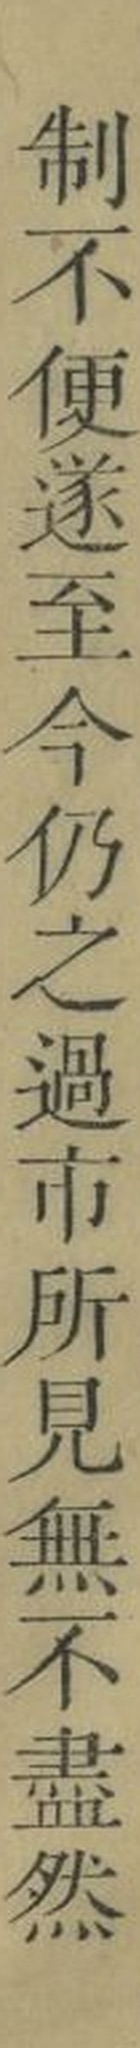制不便遂至今仍之過市所見無不尽然
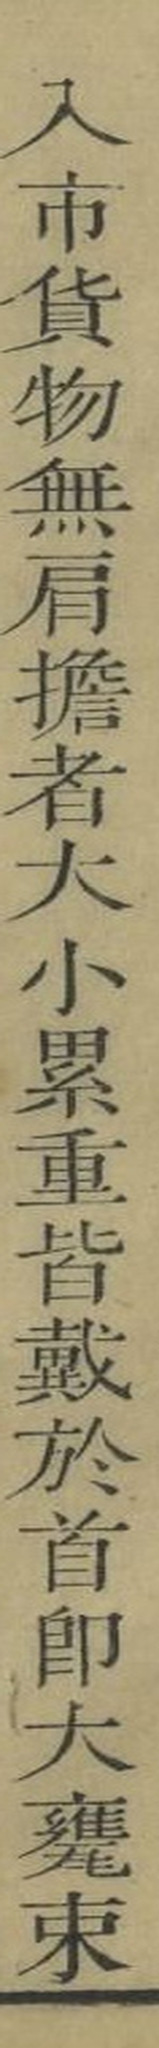入市貨物無肩担者大小累重皆戴於首即大甕束
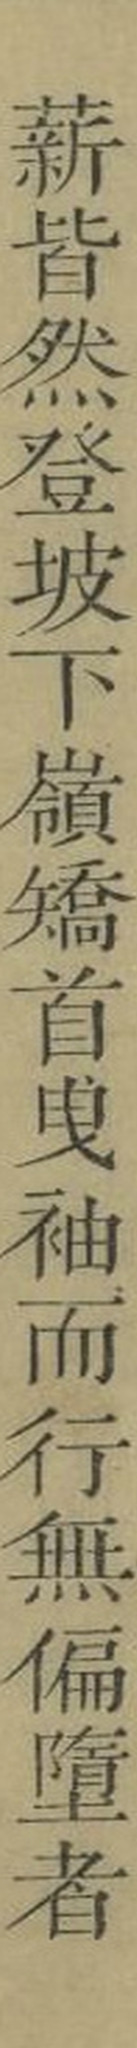薪皆然登坡下嶺矯首曳袖而行無偏墮者
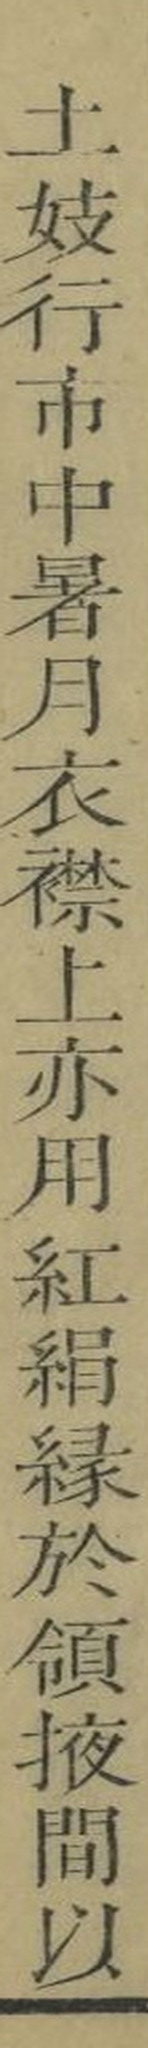土妓行市中暑月衣襟上亦用紅絹縁於領掖間以
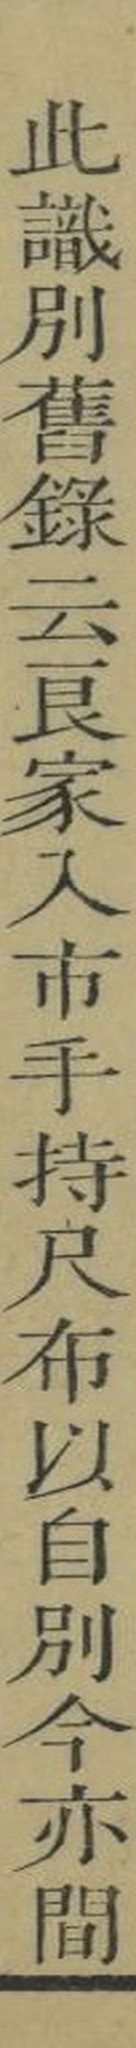此識別旧録云良家入市手持尺布以自別今亦間
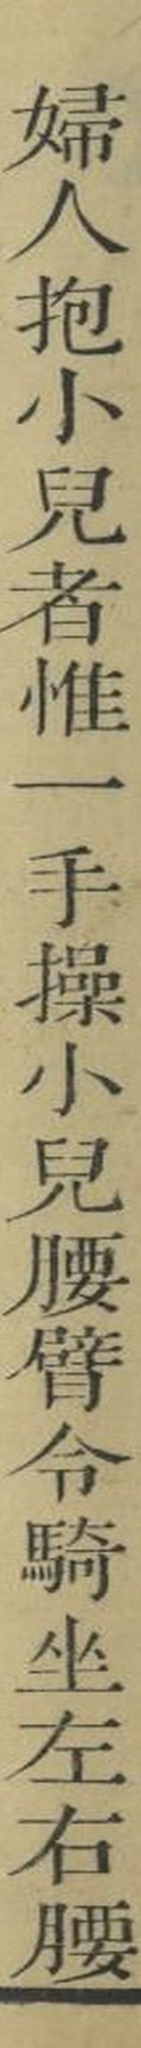婦人抱小児者惟一手操小児腰臂令騎坐左右腰
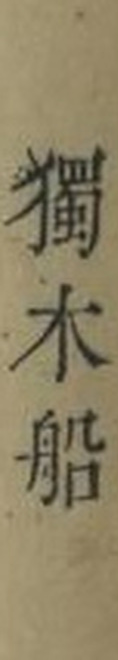独木船

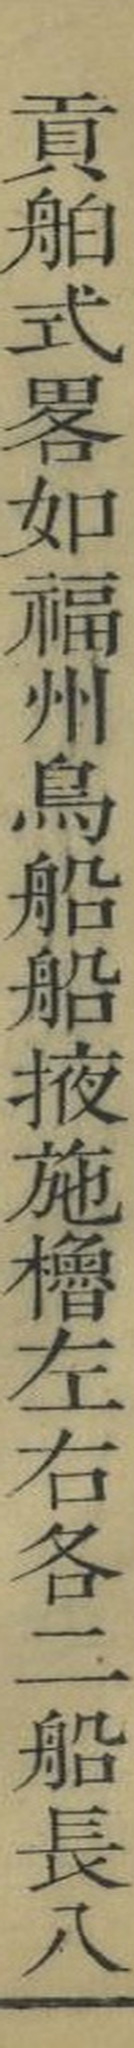貢舶式略如福州鳥船船掖施櫓左右各二船長八
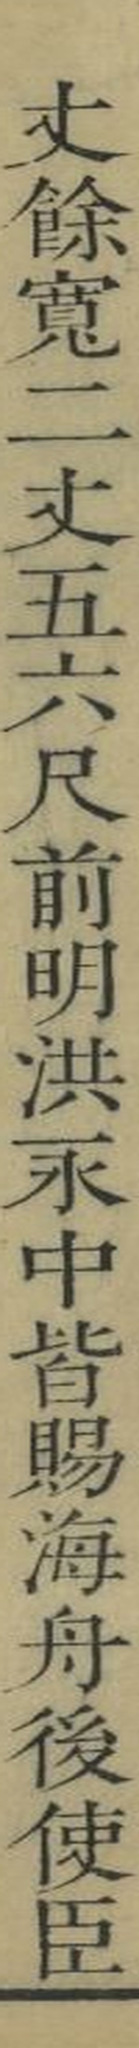丈余寛二丈五六尺前明洪永中皆賜海舟後使臣
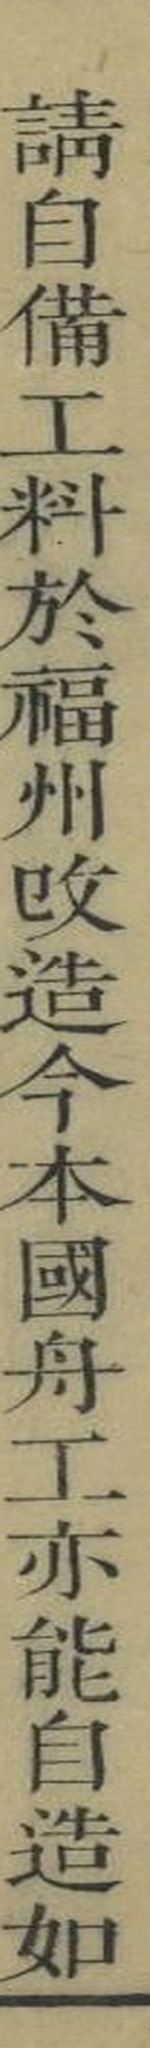請自備工料於福州改造今本国舟工亦能自造如
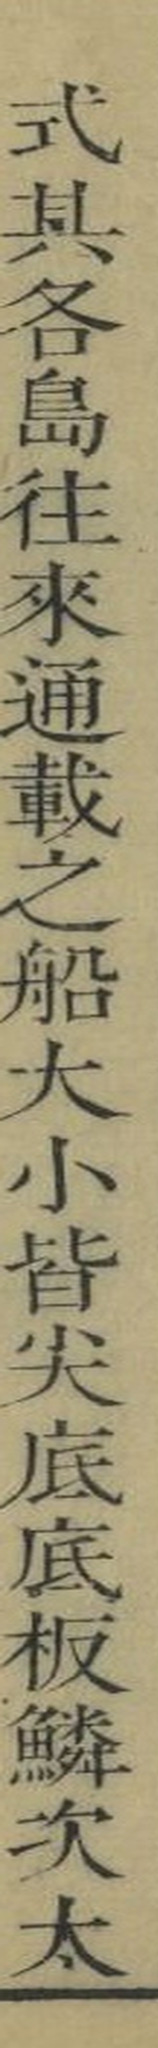式其各島往来通載之船大小皆尖底底板鱗次太
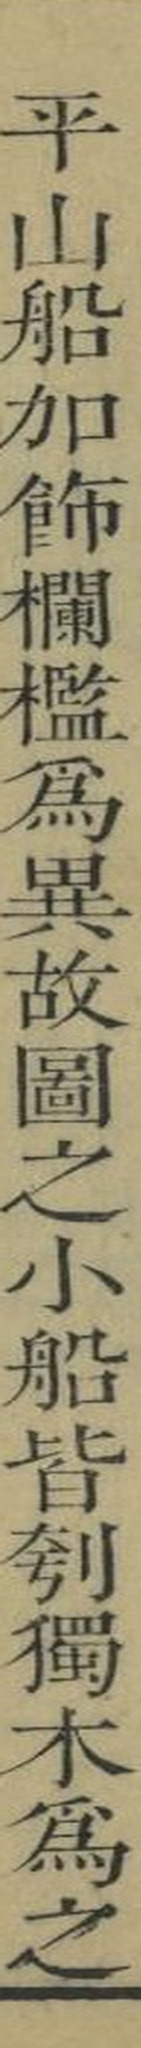平山船加飾欄檻為異故図之小船皆刳独木為之
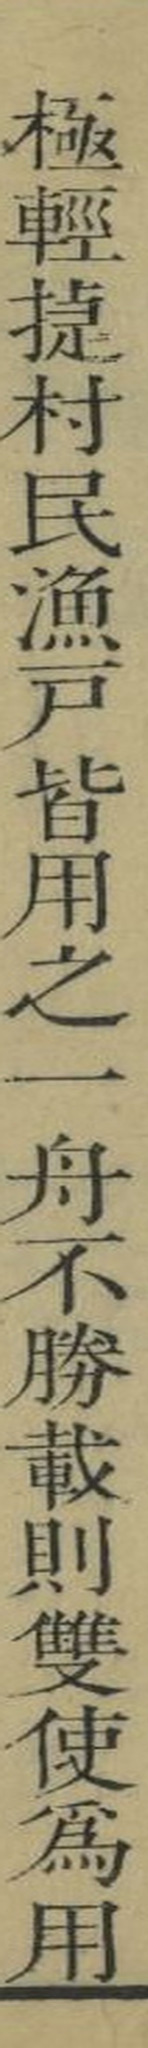極軽㨗村民漁戸皆用之一舟不勝載則双使為用

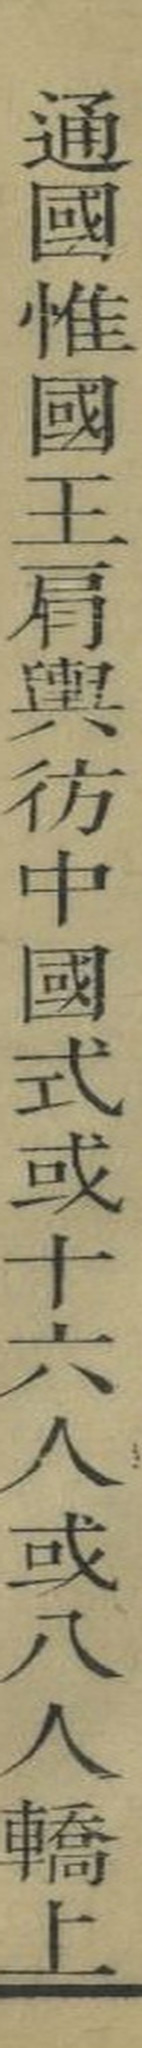通国惟国王肩輿彷中国式或十六人或八人轎上
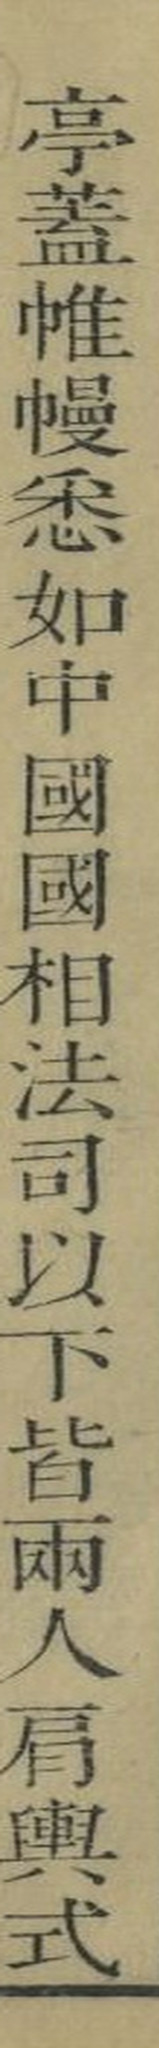亭蓋帷幔悉如中国国相法司以下皆両人肩輿式
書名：中山伝信録 巻六
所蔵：University of the Ryukyus Library
